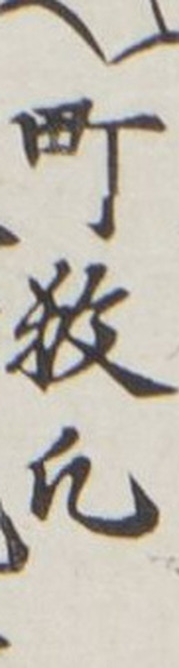町数凡
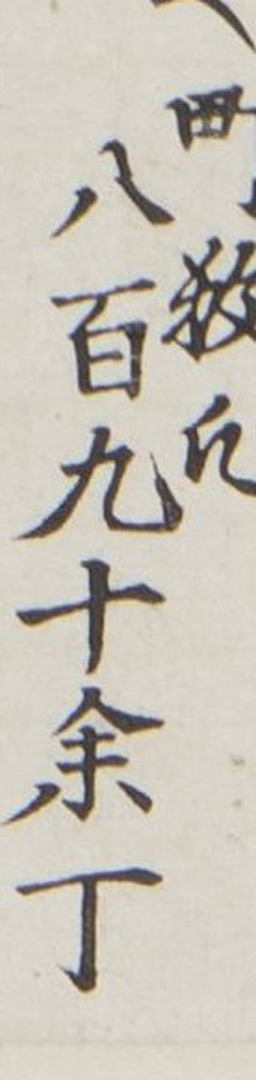八百九十余丁
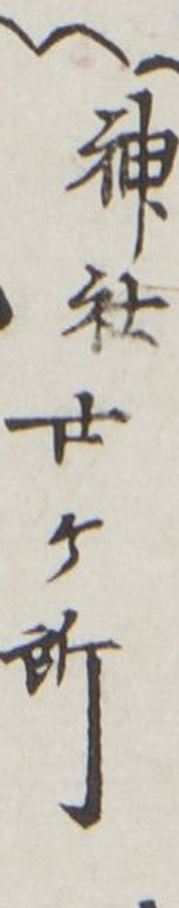神社廿ヶ所
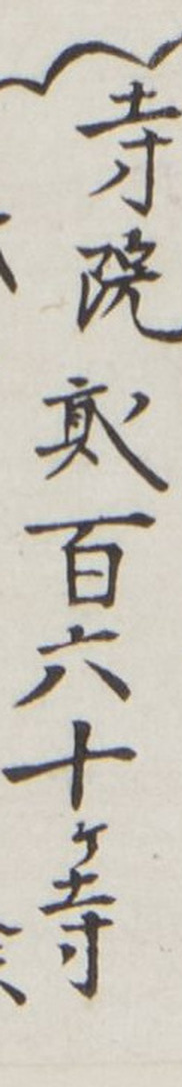寺院弐百六十ヶ寺
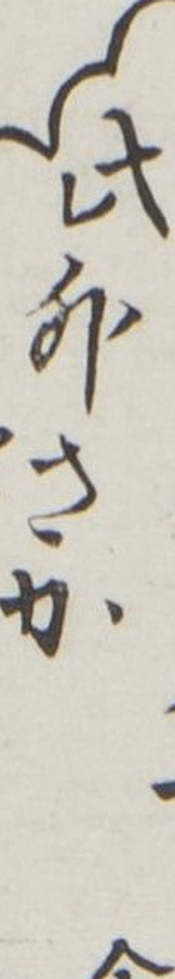此外さか
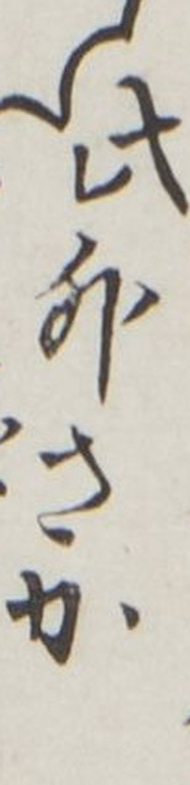此外さか
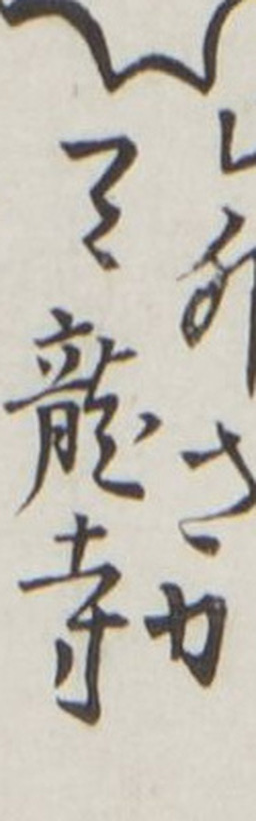天龍寺
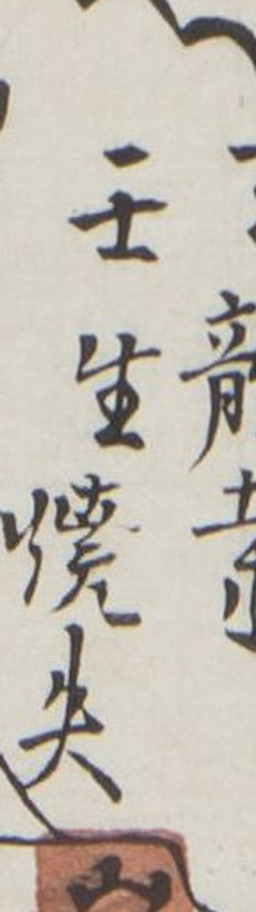壬生焼失
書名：京都大火本しらべ
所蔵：あいおいニッセイ同和損保株式会社
